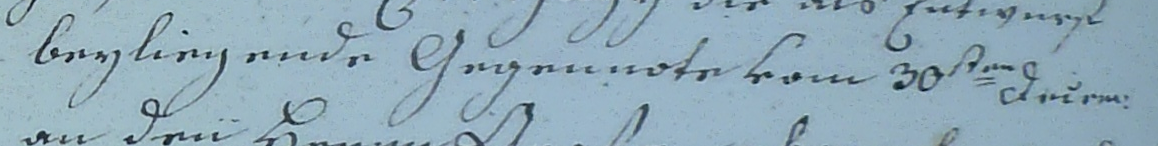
beyliegende Gegennote vom 30ste͇n Decem:
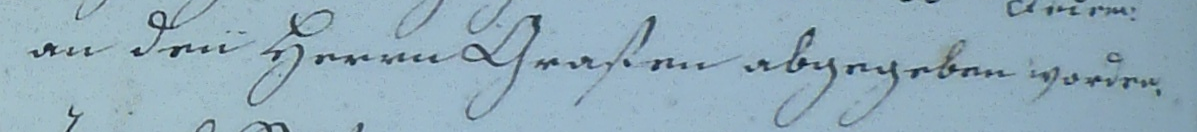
an den Herrn Grafen abgegeben worden.
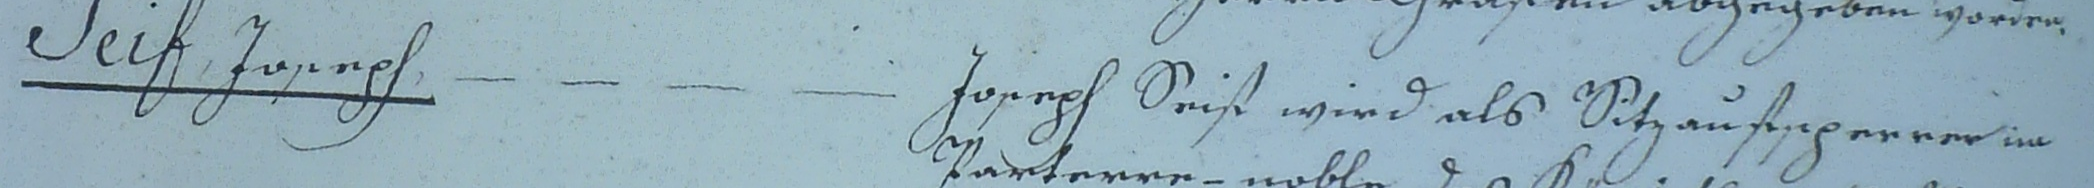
Seif, Joseph, _ _ _ _ Joseph Seif wird als Sitzaufsperrer im
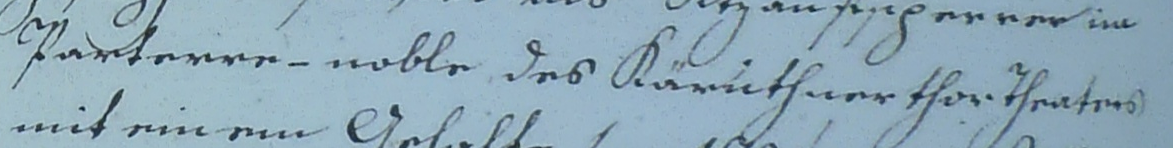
Parterre – noble des Kärnthnerthor Theaters
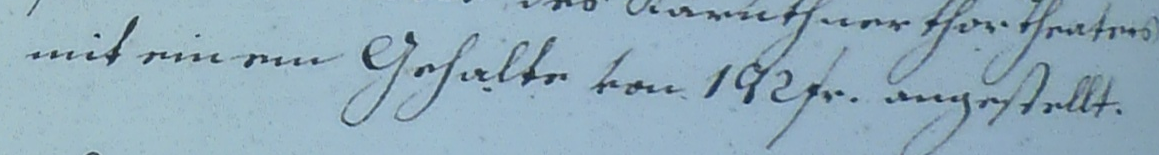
mit einem Gehalte von 192 fr. angestellt.
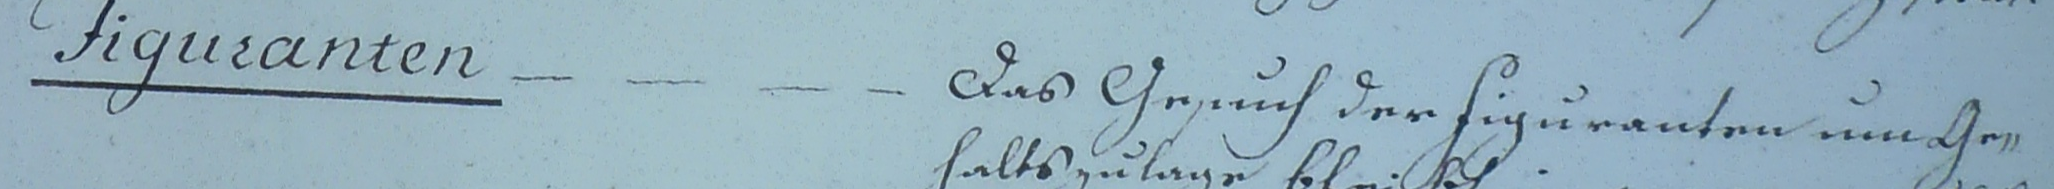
Figuranten _ _ _ _ Das Gesuch der Figuranten um Ge¬
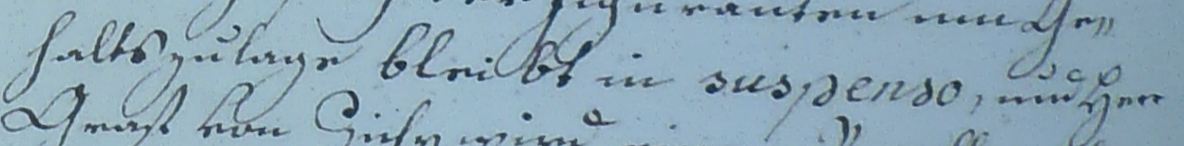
haltszulage bleibt in suspenso, und Herr
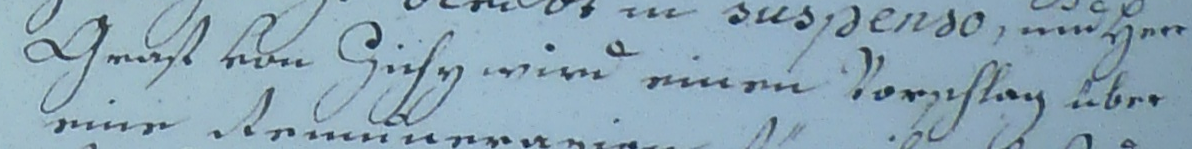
Graf von Zichy wird einen Vorschlag über
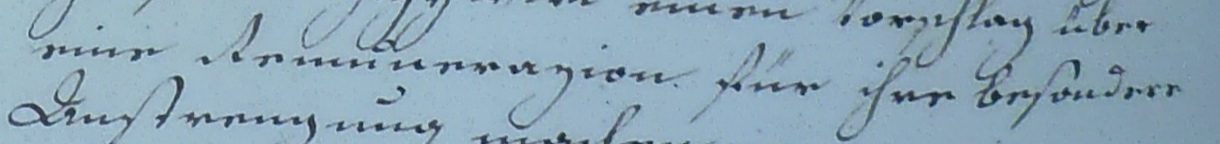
eine Remunerazion für ihre besondere
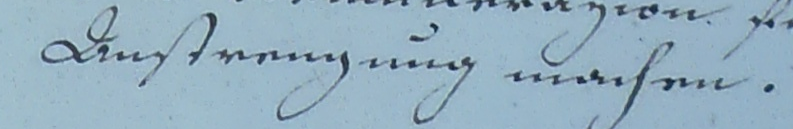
Anstrengung machen.
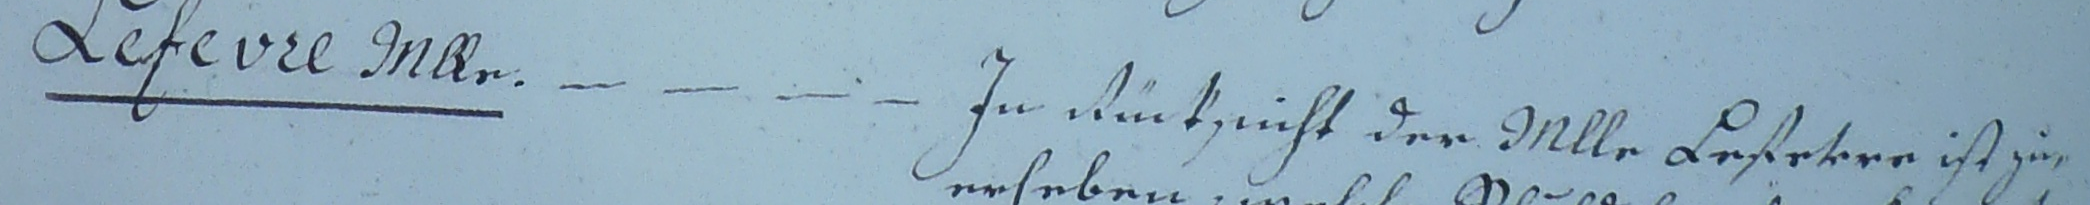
Lefevre Mlle. _ _ _ _ In Rücksicht der Mlle Lefevre ist zu¬
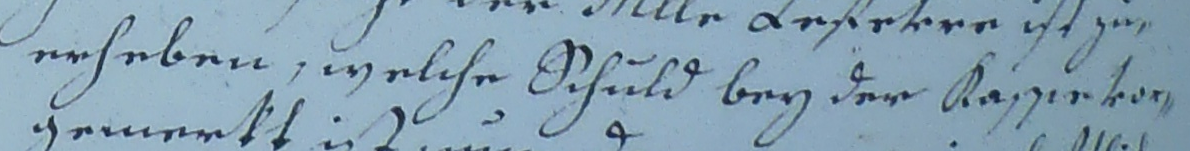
erheben, welche Schuld bey der Kasse vor¬
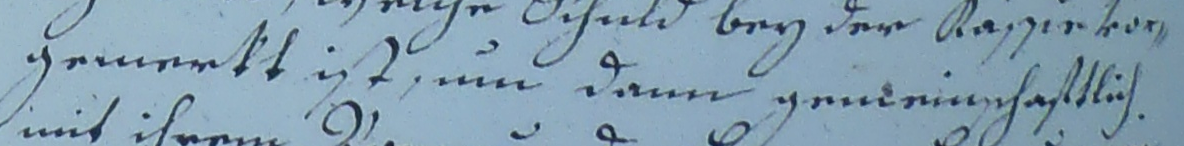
gemerkt ist, um dann gemeinschaftlich
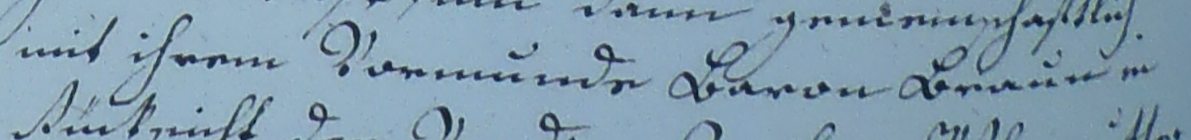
mit ihrem Vormunde Baron Braun in
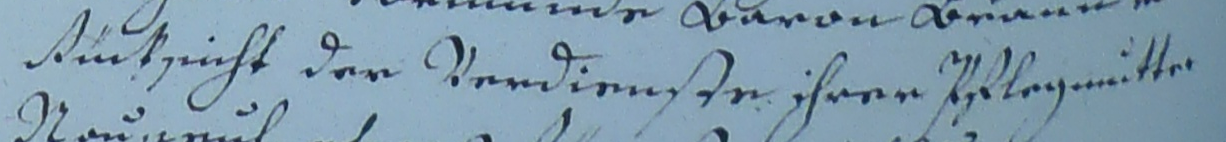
Rücksicht der Verdienste ihrer Pflegmutter
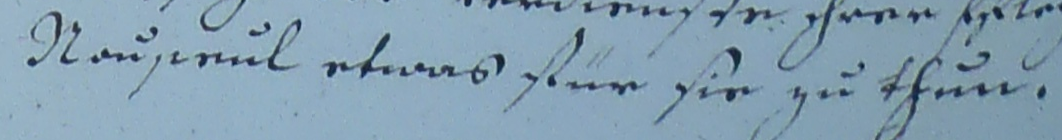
Nouseul etwas für sie zu thun.
